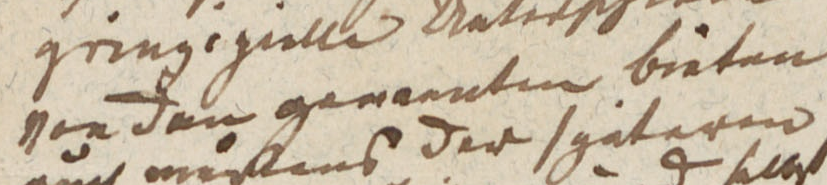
von den genannten bieten
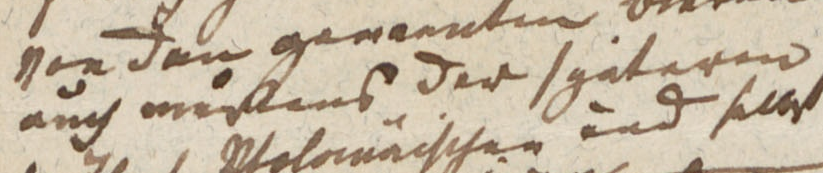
auch meistens der späteren
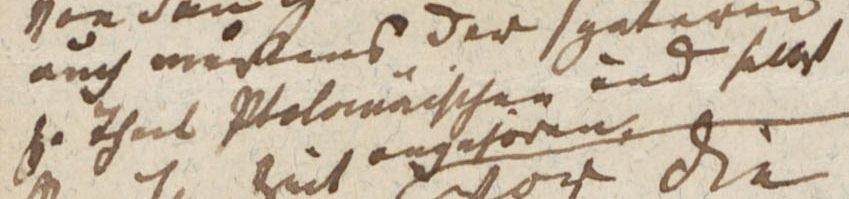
z. Theil Ptolemäischen und selbst
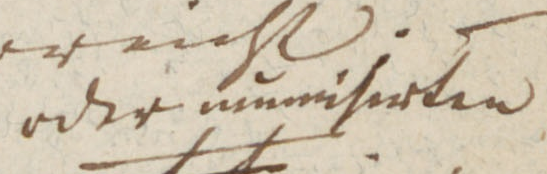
oder mumisirten
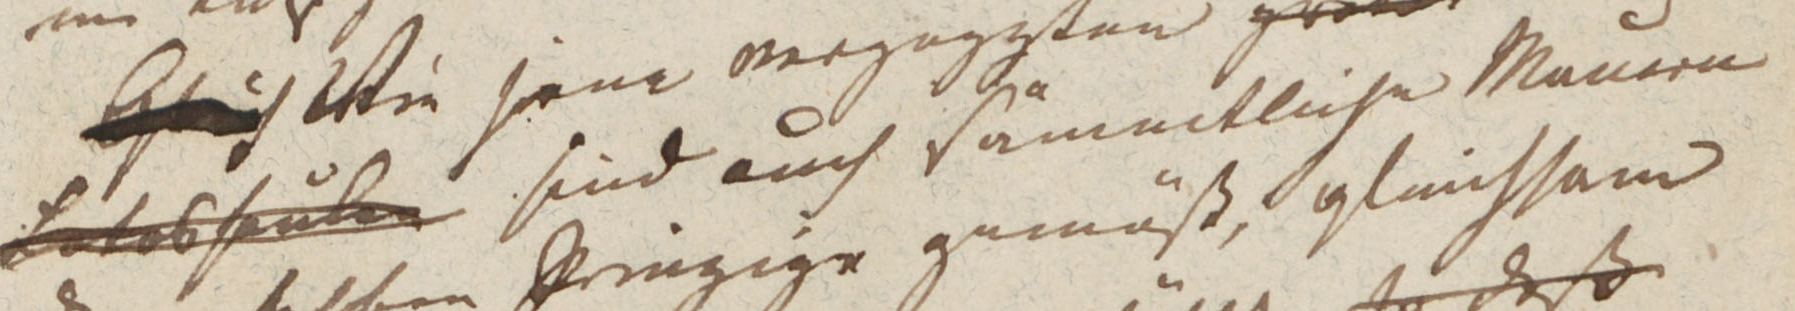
Lotossäulen sind auch sämmtliche Mauern
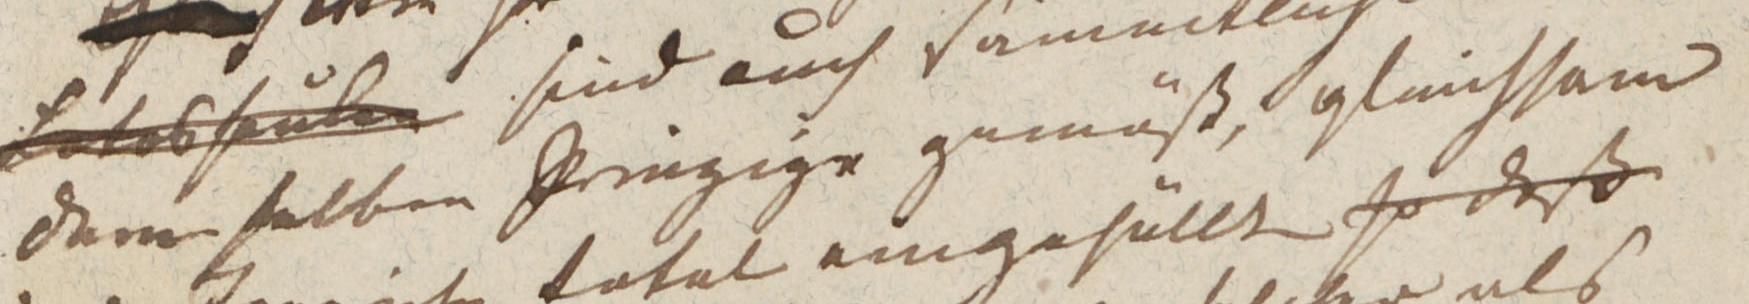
demselben Prinzipe gemäss, gleichsam
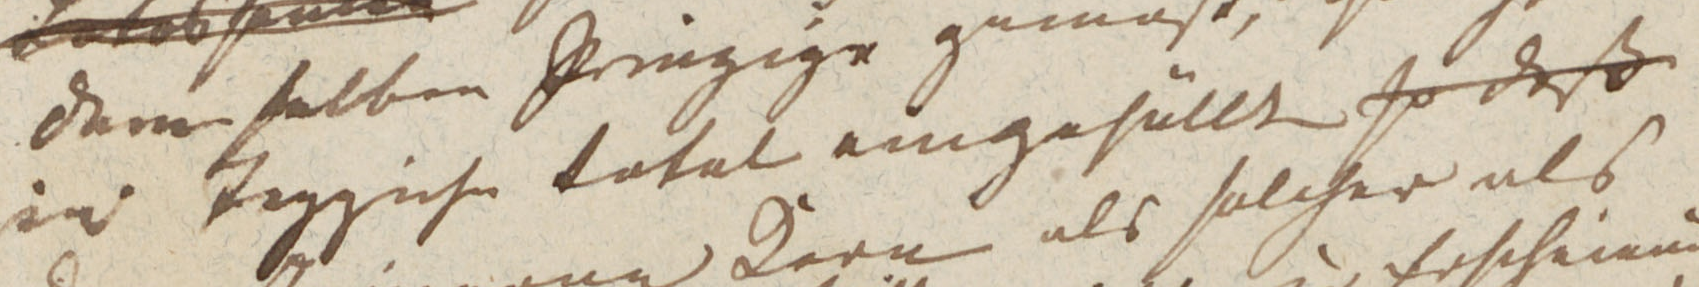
in Teppiche total eingehüllt so dass
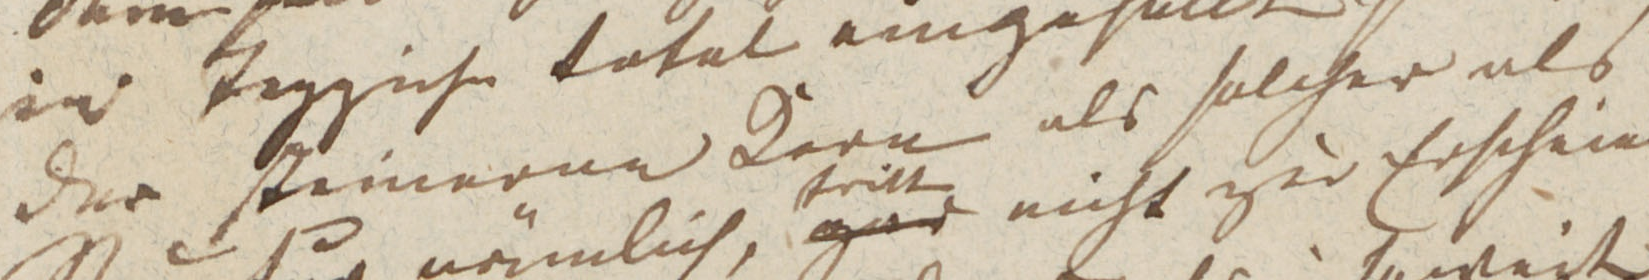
der steinerne Kern als solcher als
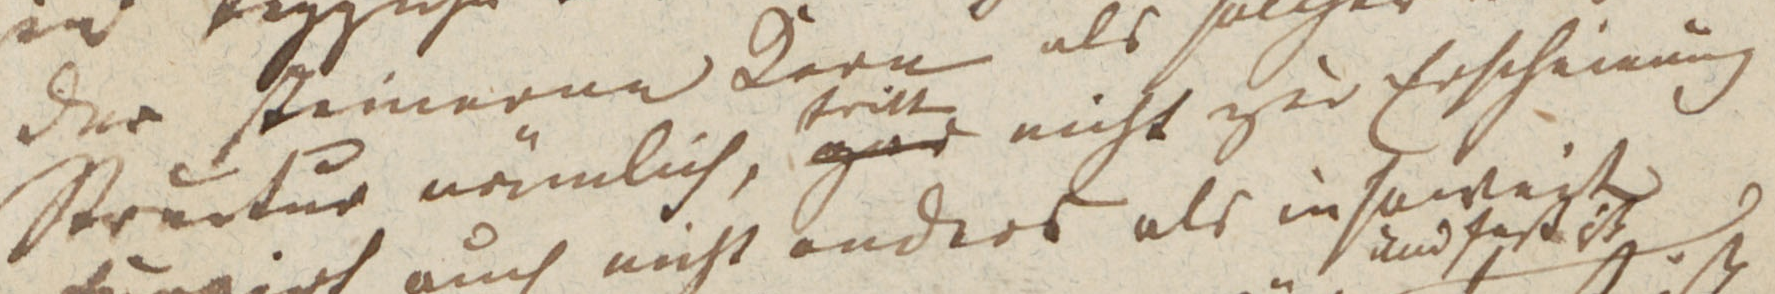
Structur nämlich, gar tritt nicht zur Erscheinung
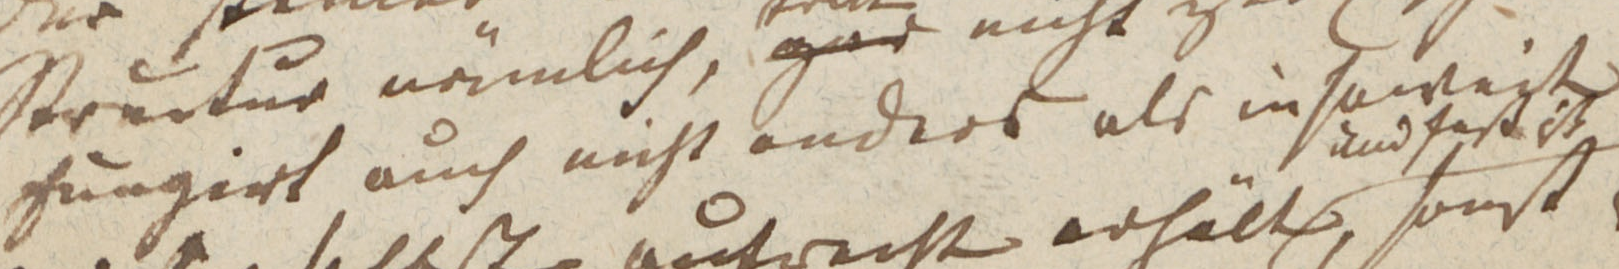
fungirt auch nicht anders als insoweit
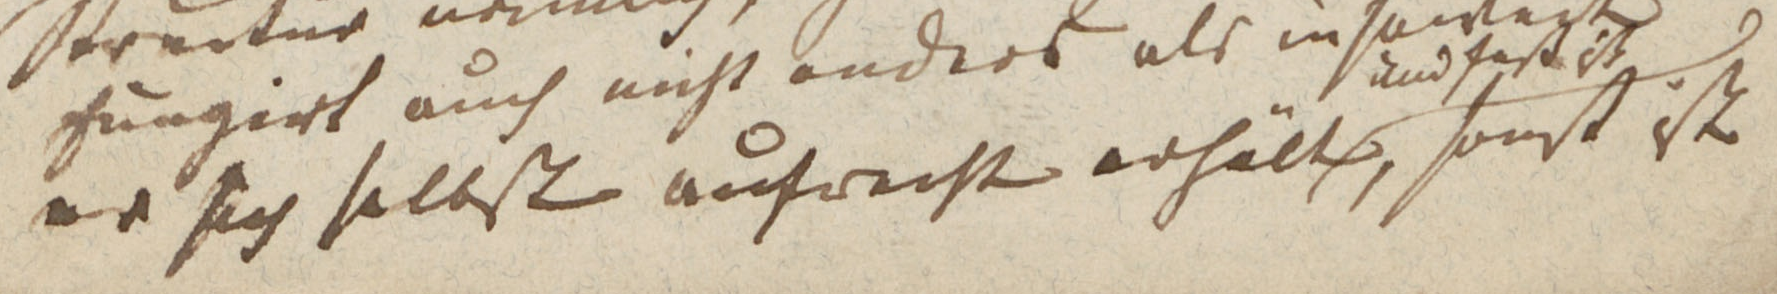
er sich selbst aufrecht erhält und fest ist,
